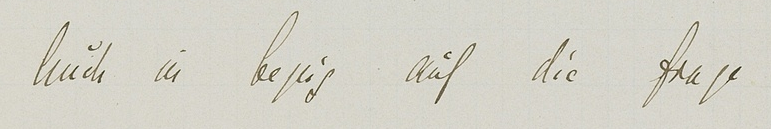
Auch in Bezug auf die Frage
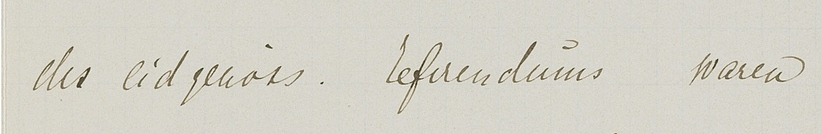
des eidgenöss. Referendums waren
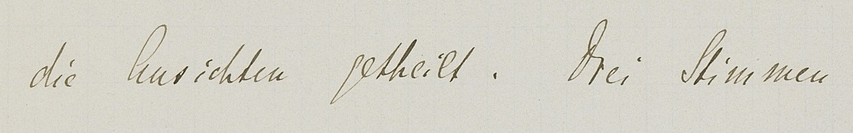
die Ansichten getheilt. Drei Stimmen
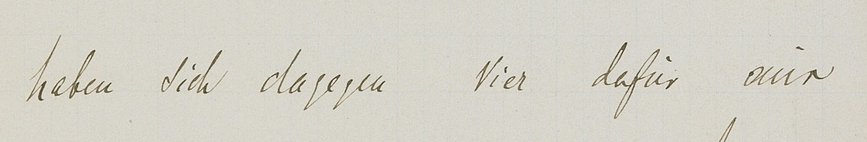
haben sich dagegen vier dafür aus-
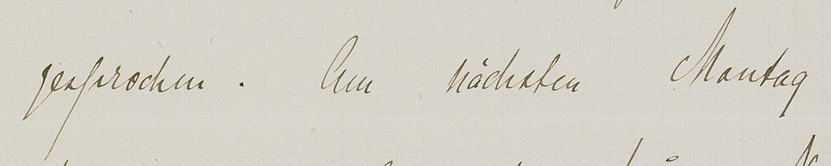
gesprochen. Am nächsten Montag
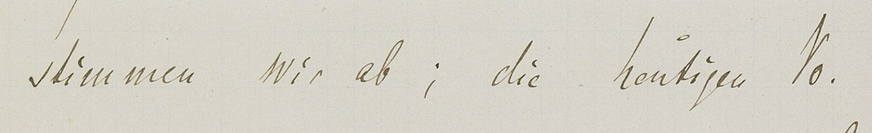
stimmen wir ab; die heutigen Vo-
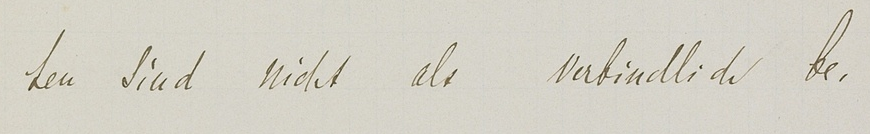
ten sind nicht als verbindlich be-
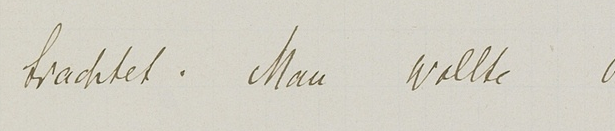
trachtet. Man wollte
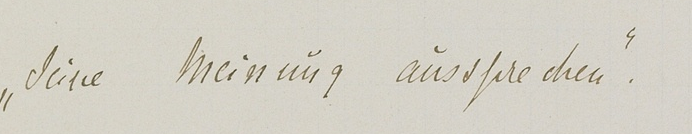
«seine Meinung aussprechen».
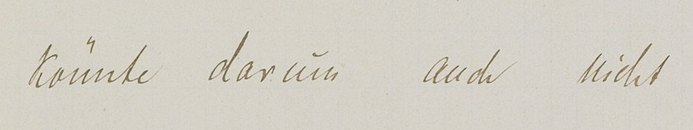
könnte darum auch nicht
